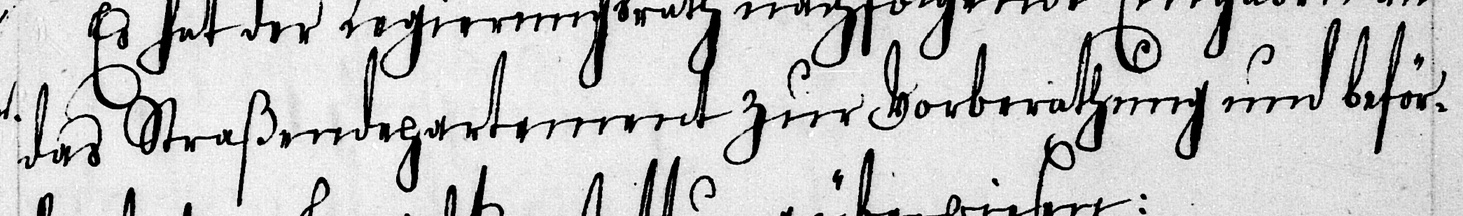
das Straßendepartement zur Vorberathung und beför¬
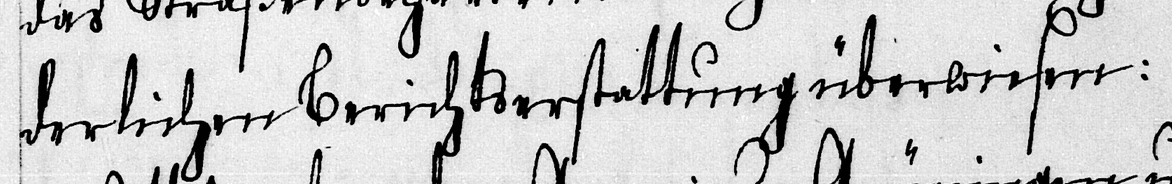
derlichen Berichtserstattung überwiesen:
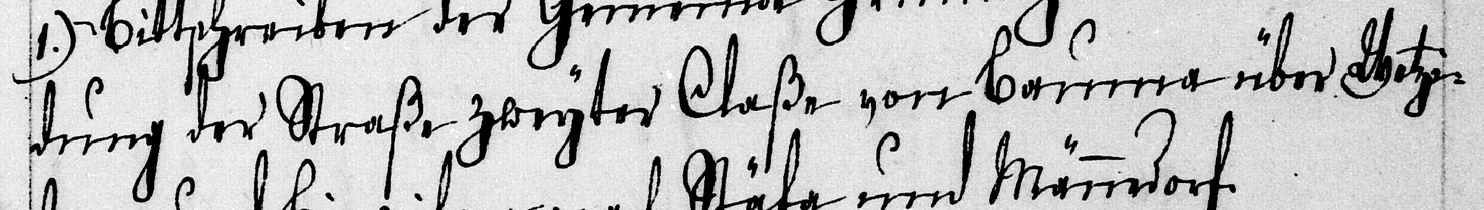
dung der Straße zweyter Claße von Bauma über Wetzi¬
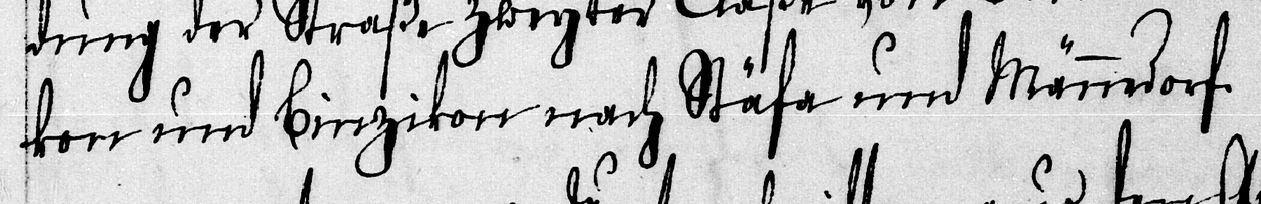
kon und Binzikon nach Stäfa und Männedorf.
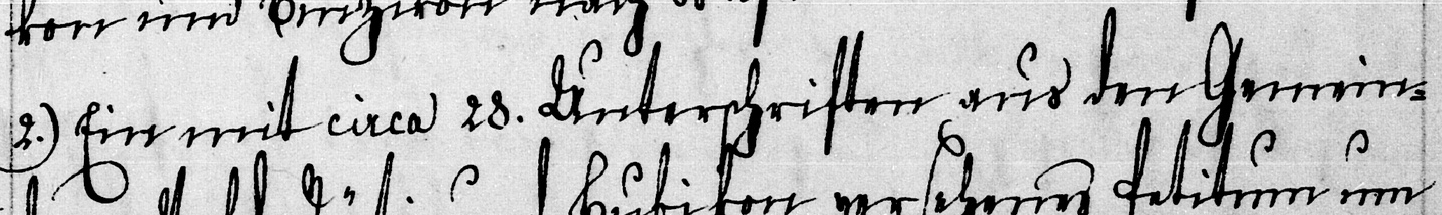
2.) Ein mit circa 28. Unterschriften aus den Gemein¬
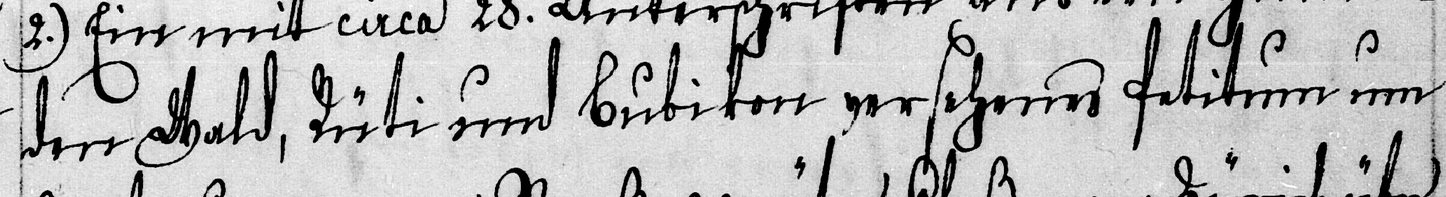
den Wald, Rüti und Bubikon versehenes Petitum um
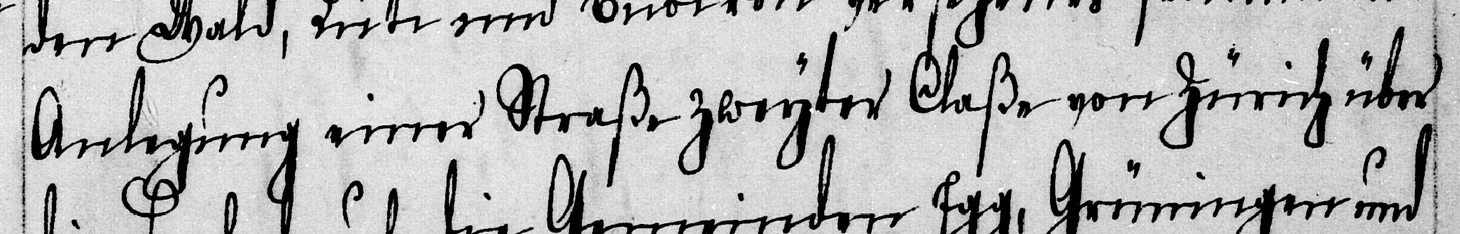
Anlegung einer Straße zweyter Claße von Zürich über
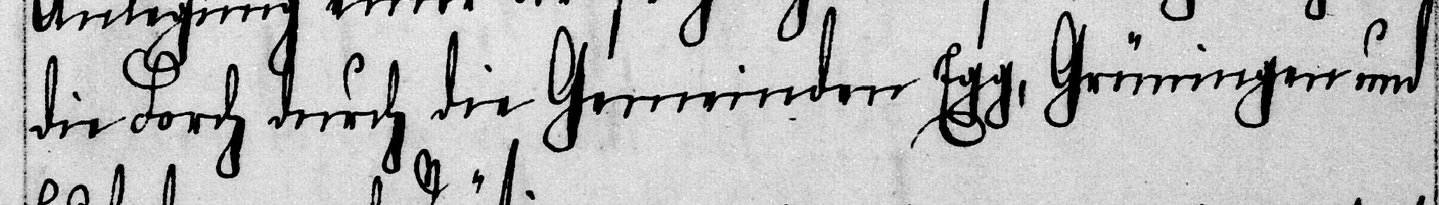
die Forch durch die Gemeinden Egg, Grüningen und
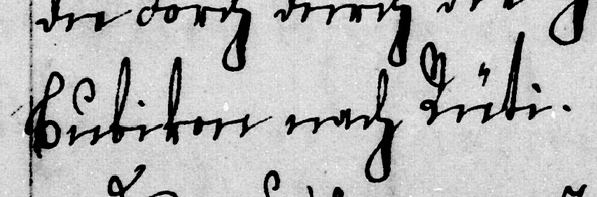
Bubikon nach Rüti.
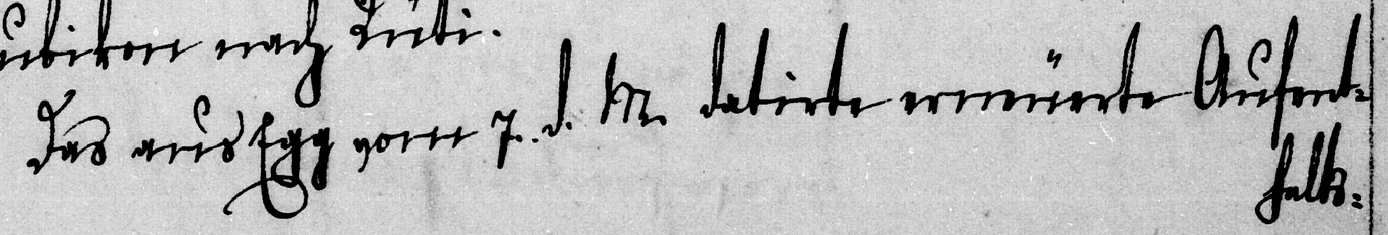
Das aus Egg vom 7. d. M. datirte erneuerte Aufent-
